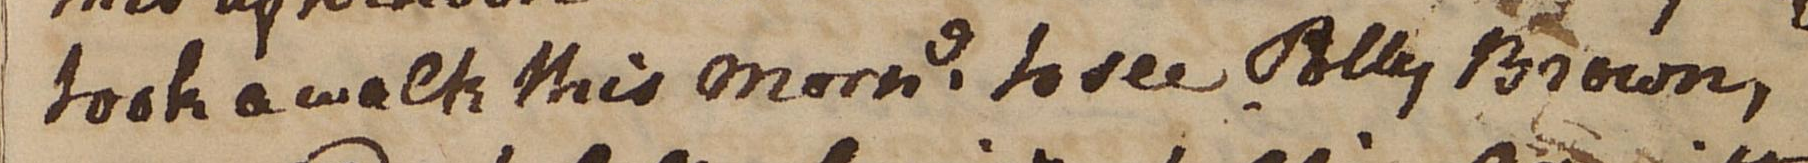took a walk this Morn^g. to see Polly Brown,
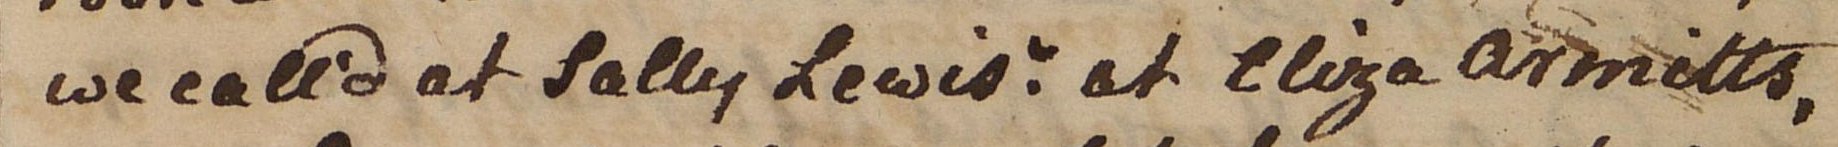we call'd at Sally Lewis^s. at Eliza Armitts,
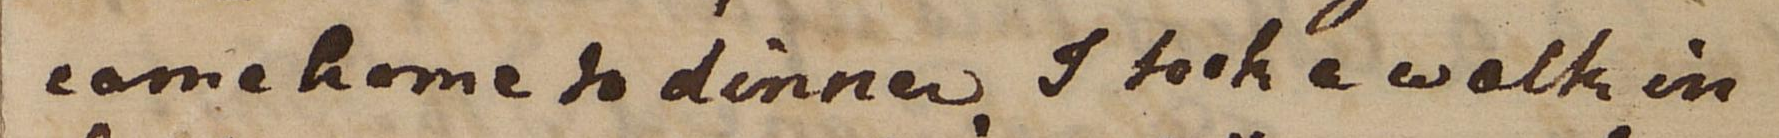came home to dinner. I took a walk in
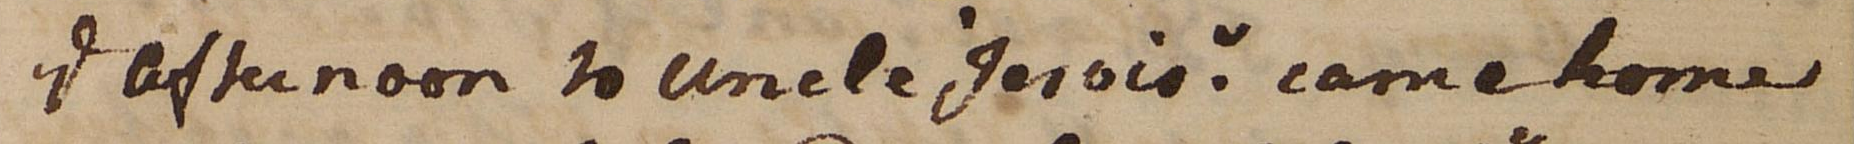y^e Afternoon to Uncle Jervis^s. came home
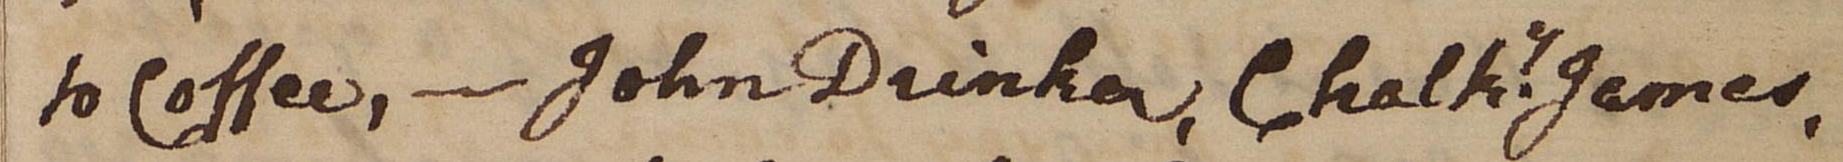to Coffee,- John Drinker, Chalk^y. James,
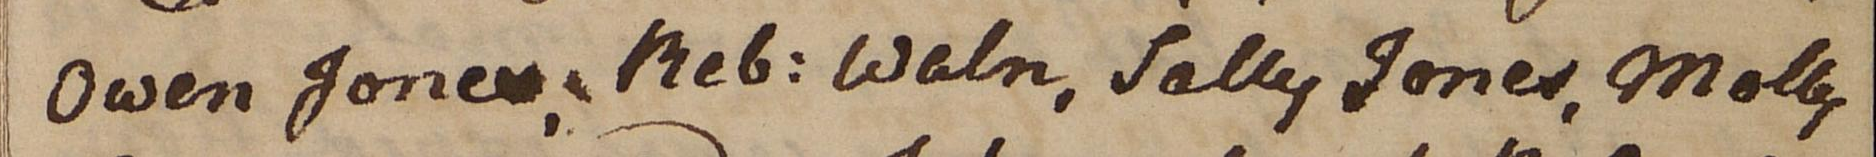Owen Jones, Reb: Waln, Sally Jones, Molly
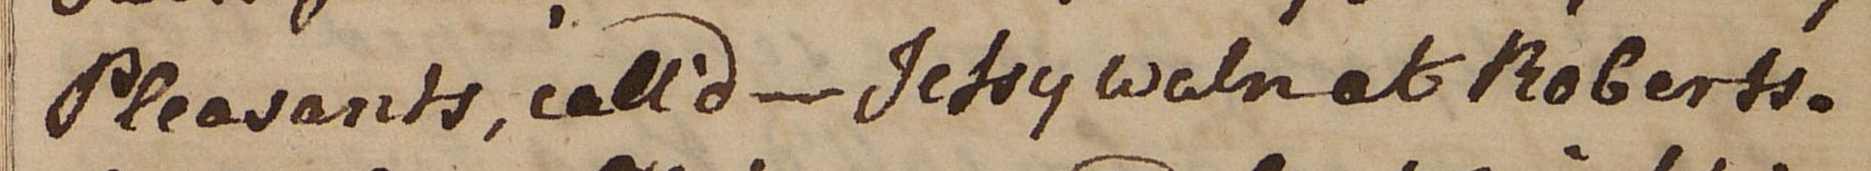Pleasants, call'd- Betsy Waln at Roberts.
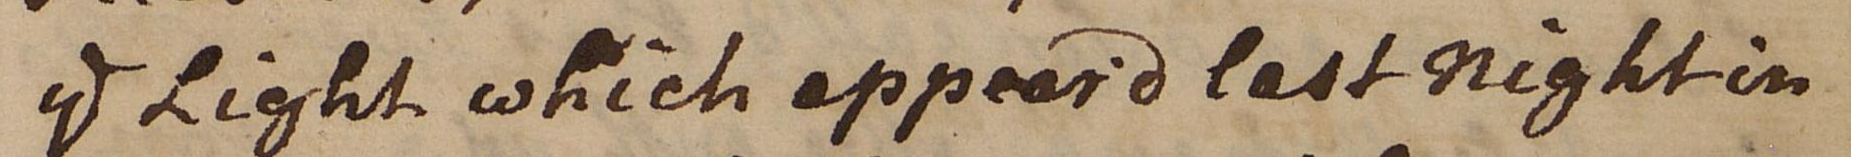y^e Light which appear'd last night in
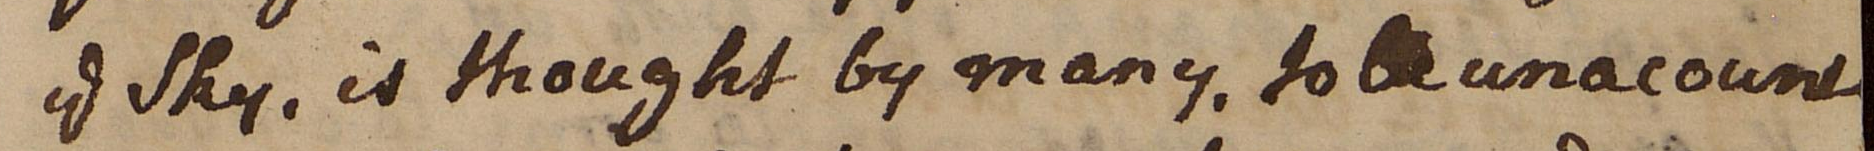y^e Sky, is thought by many, to be unacount
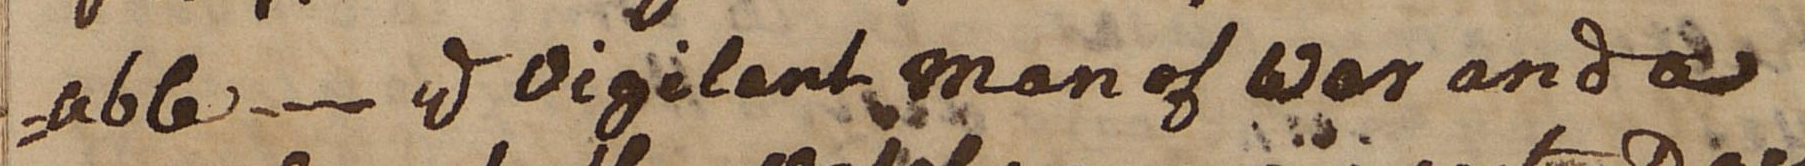- able- y^e Vigilant Man of war and a
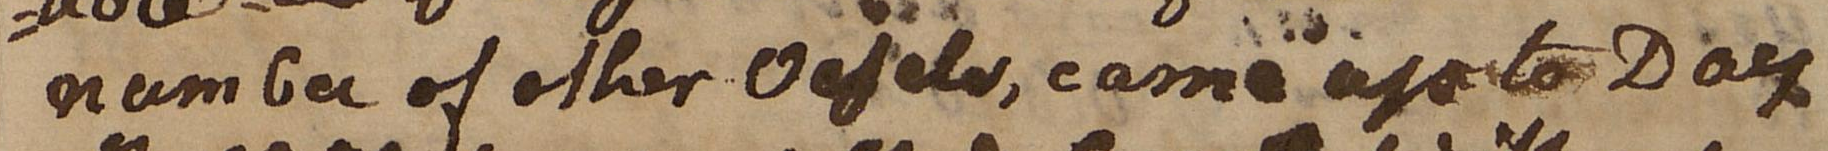number of other Vesels, came up to Day
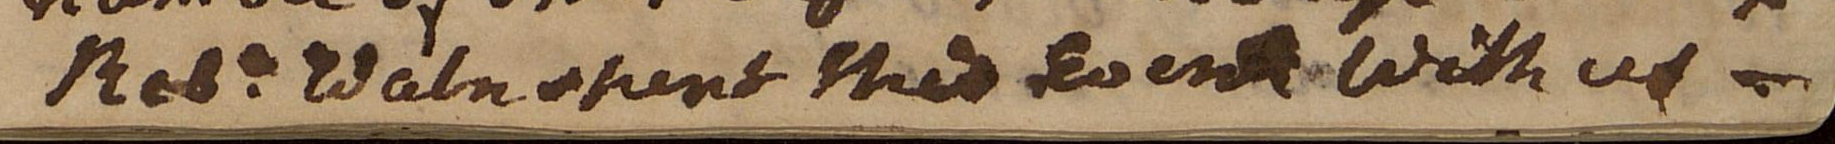Reb^a. Waln spent this Even[^g] With us-
